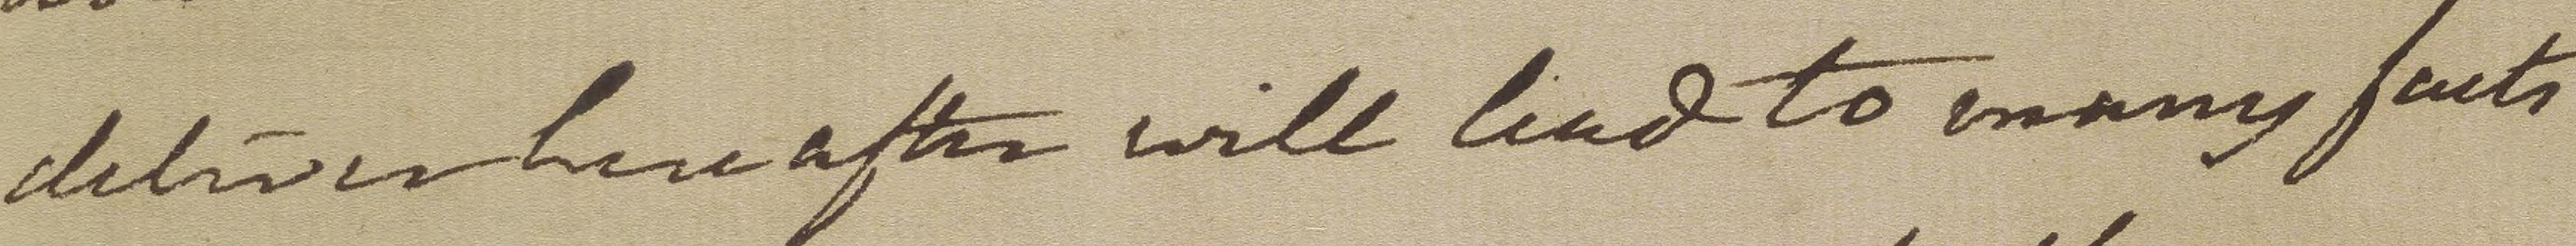deliver hereafter will lead to many facts
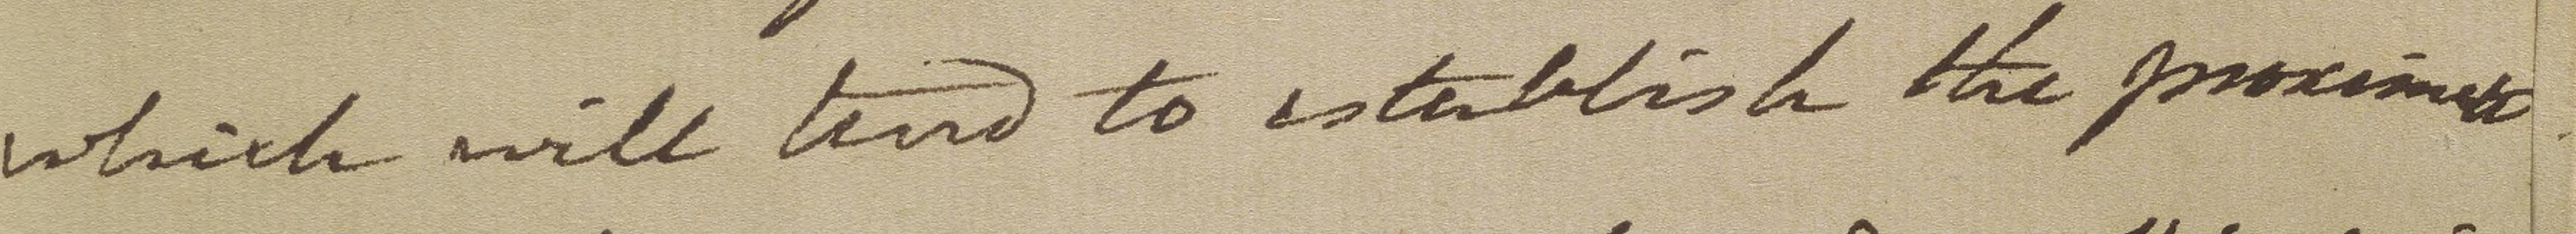which will tend to establish the proximate
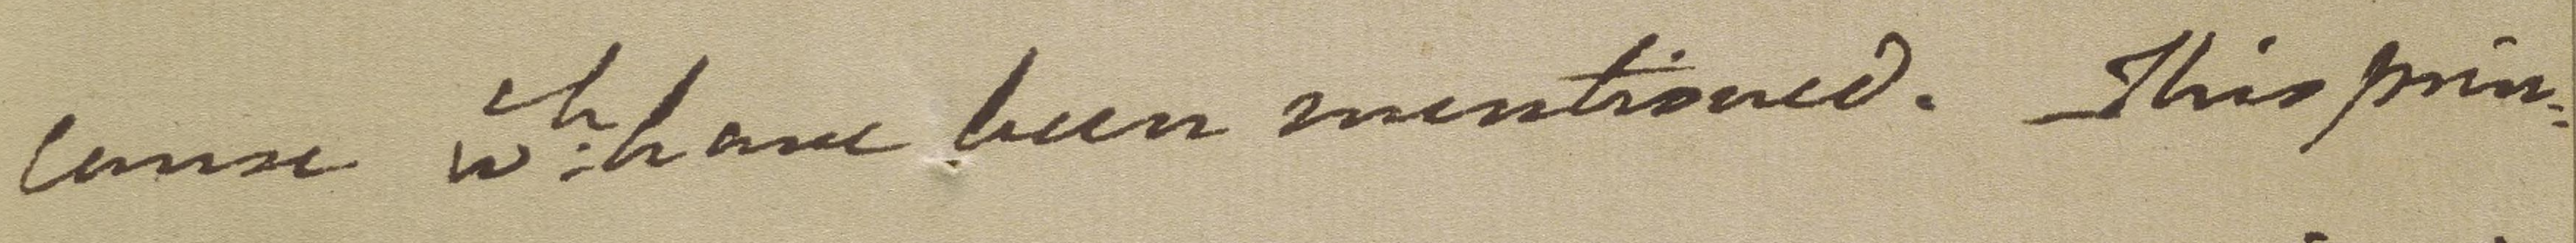cause w^ch: have been mentioned. This prin-
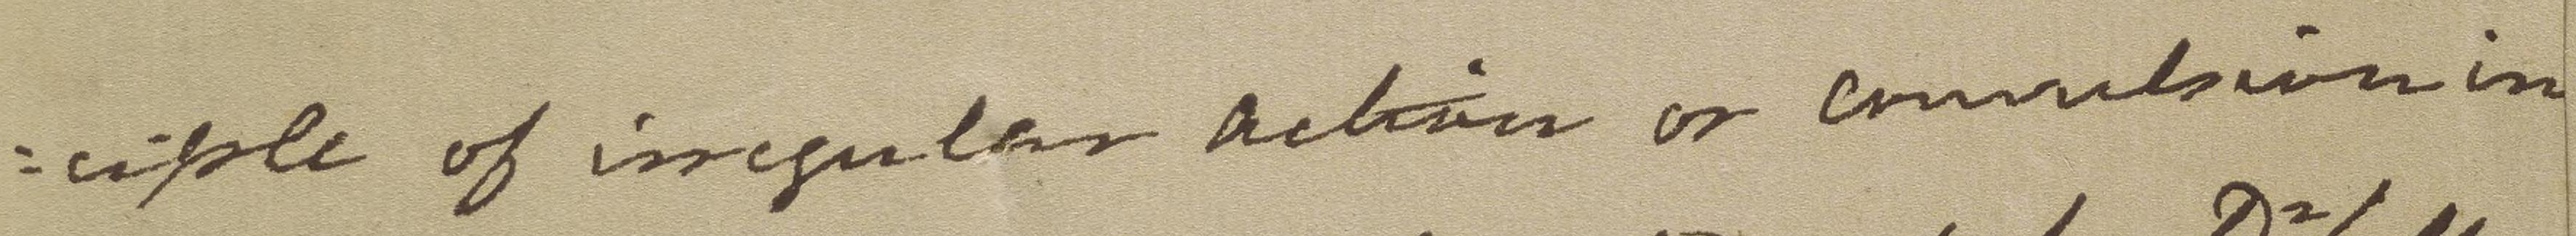-ciple of irregular action or convulsion in
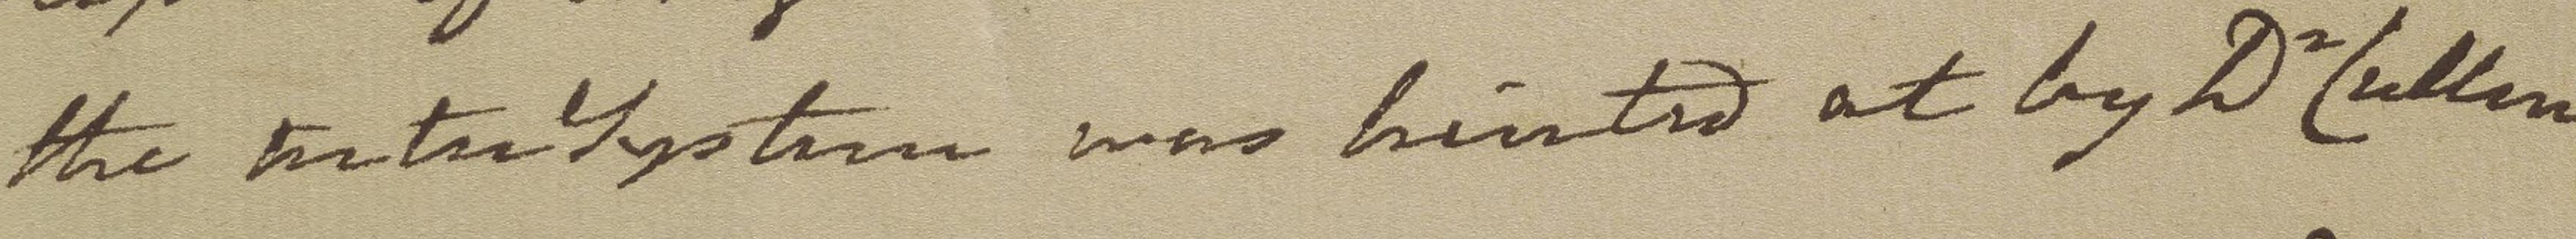the entire System was hinted at by D^r Cullen
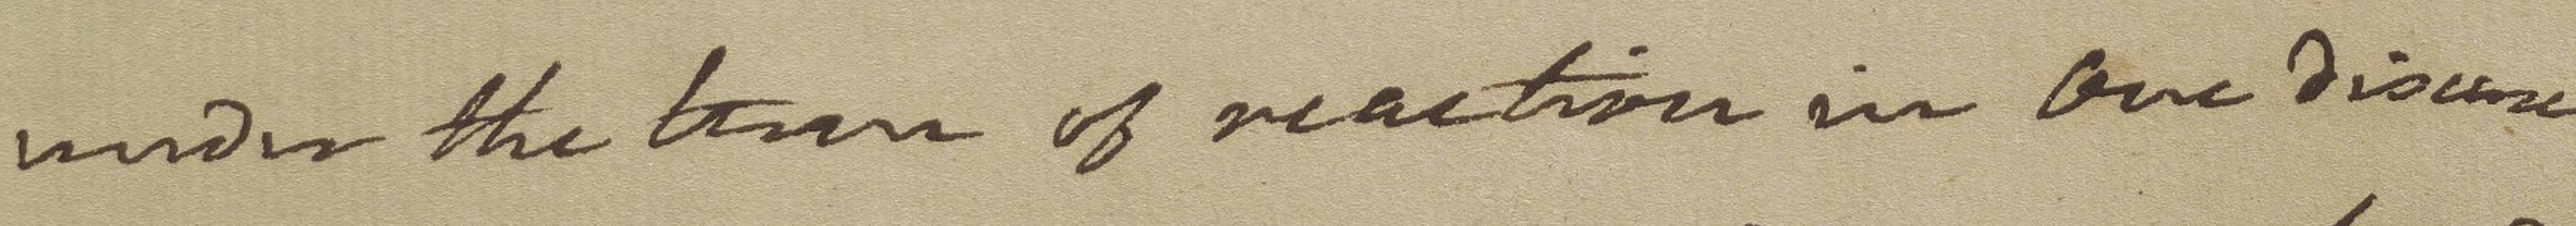under the term of reaction in one discourse
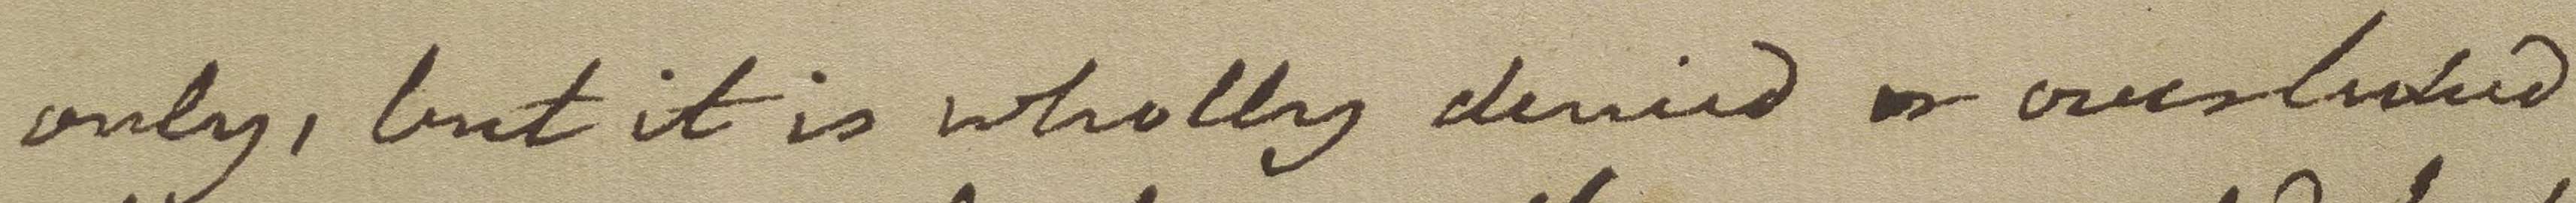only, but it is wholly denied or overlooked
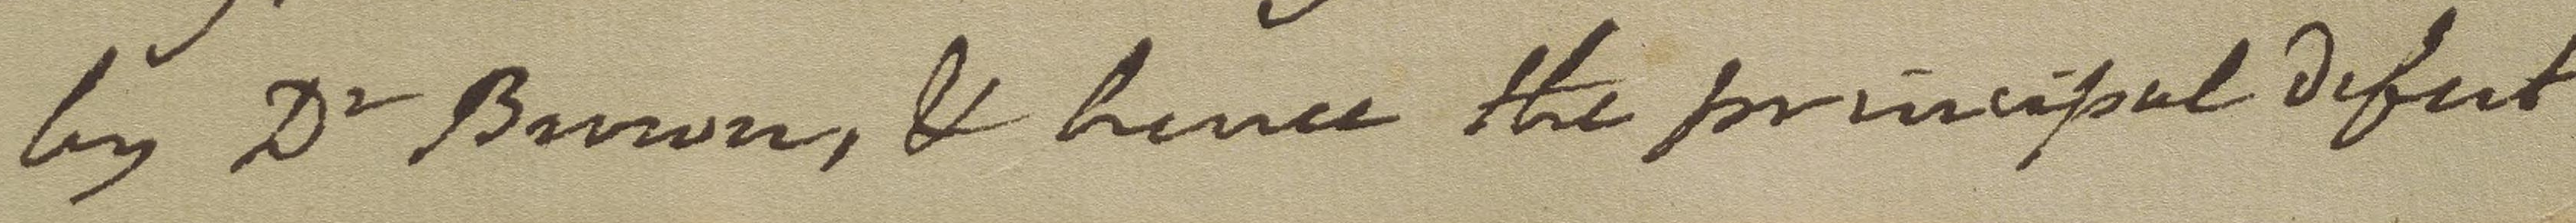by D^r Brown, & hence the principal defeat
